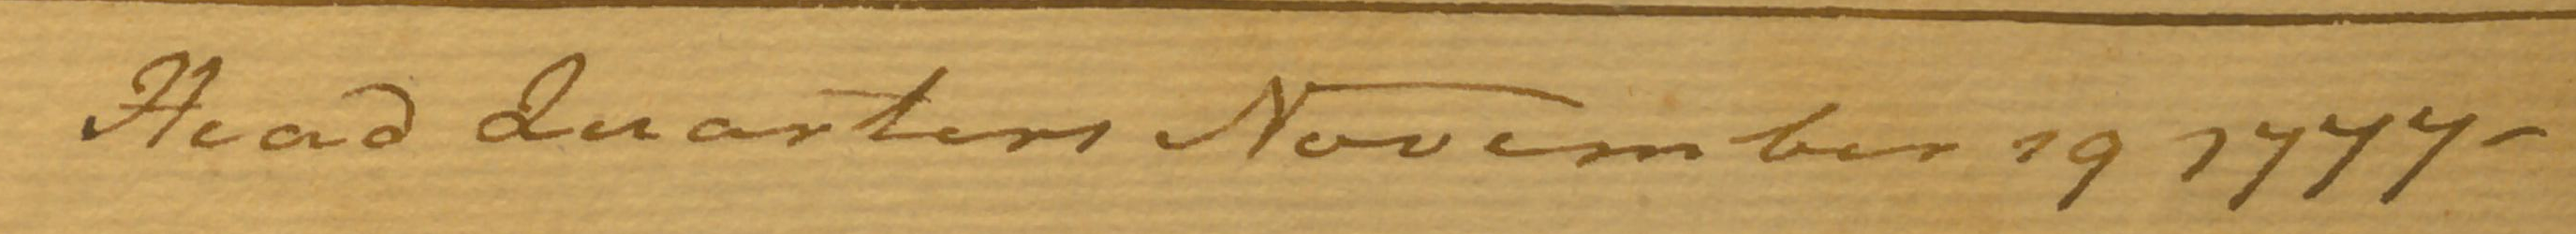Head Quarters November 19 1777-
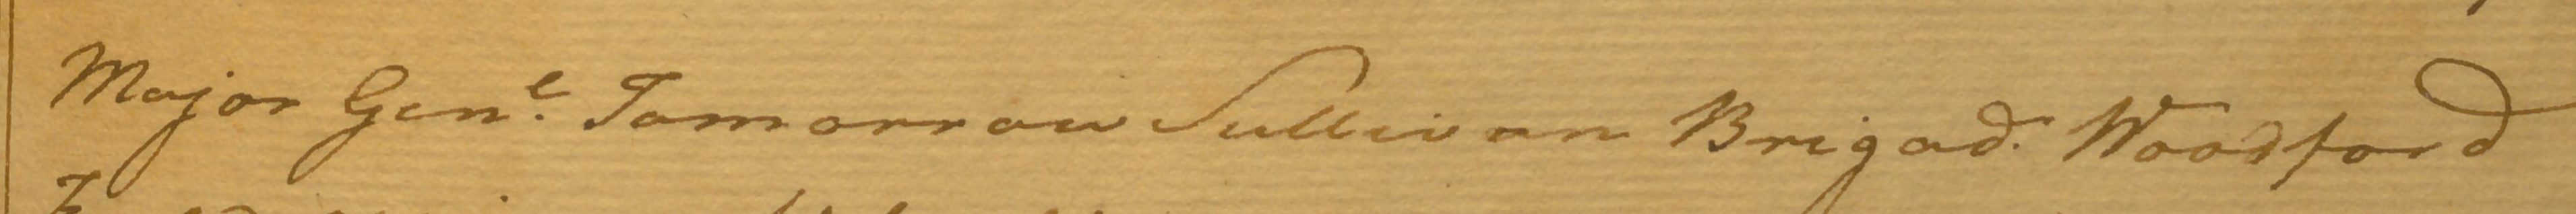Major Gen^l. Tomorrow Sullivan Brigad. Woodford
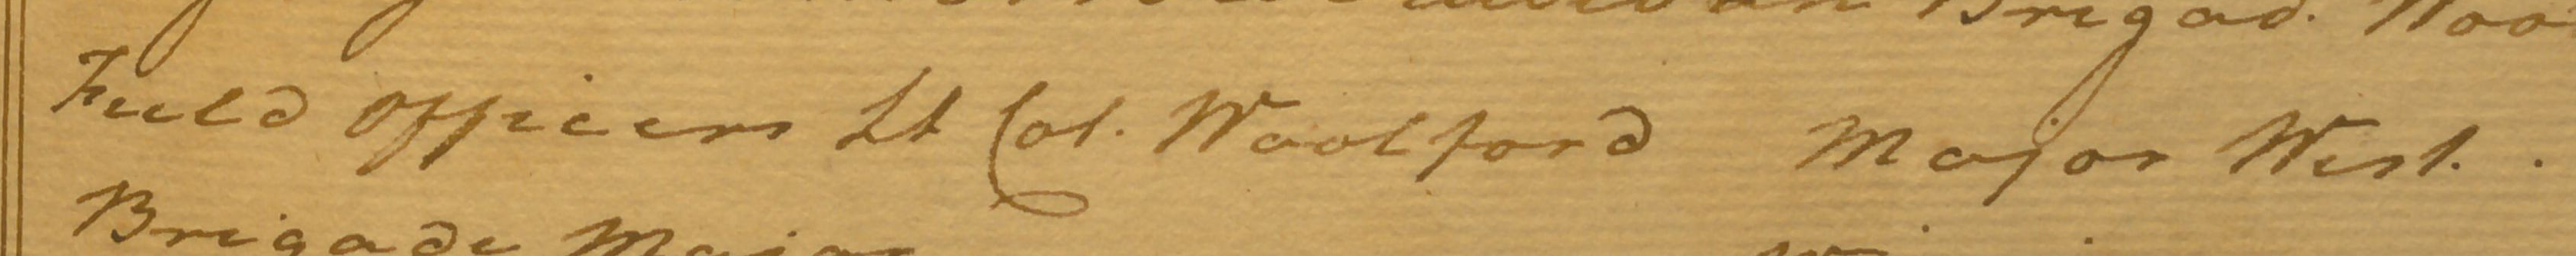Field Officers Lt Col. Woolford Major West
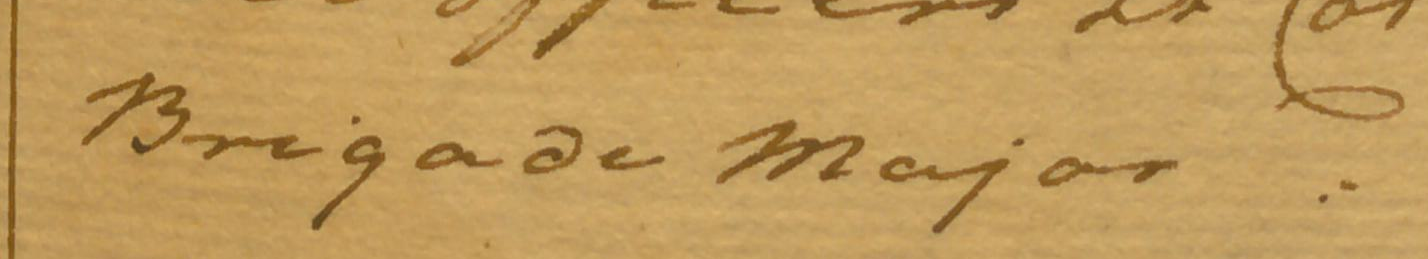Brigade Major .
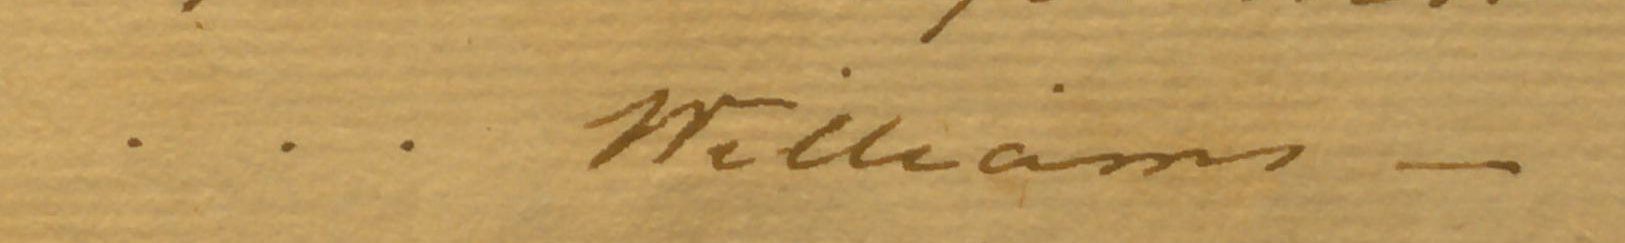... Williams-
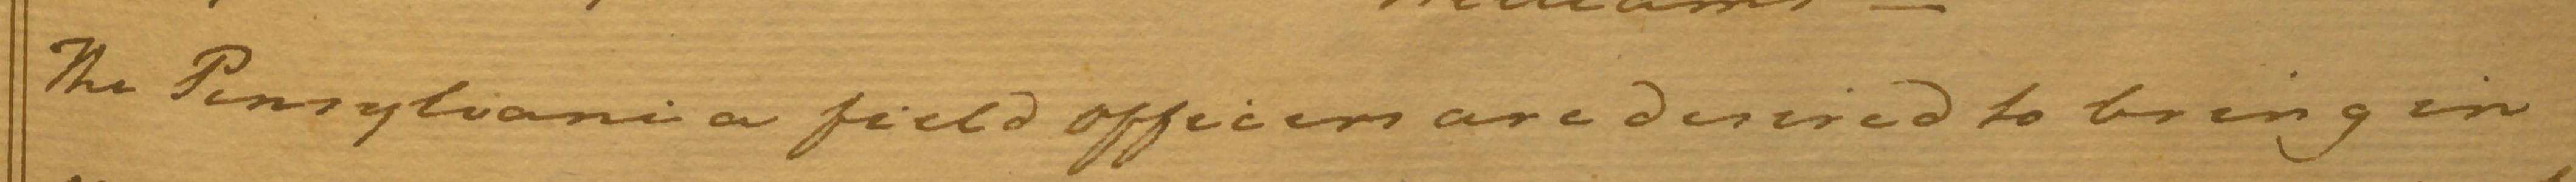The Pensylvania field officers are desired to bring in
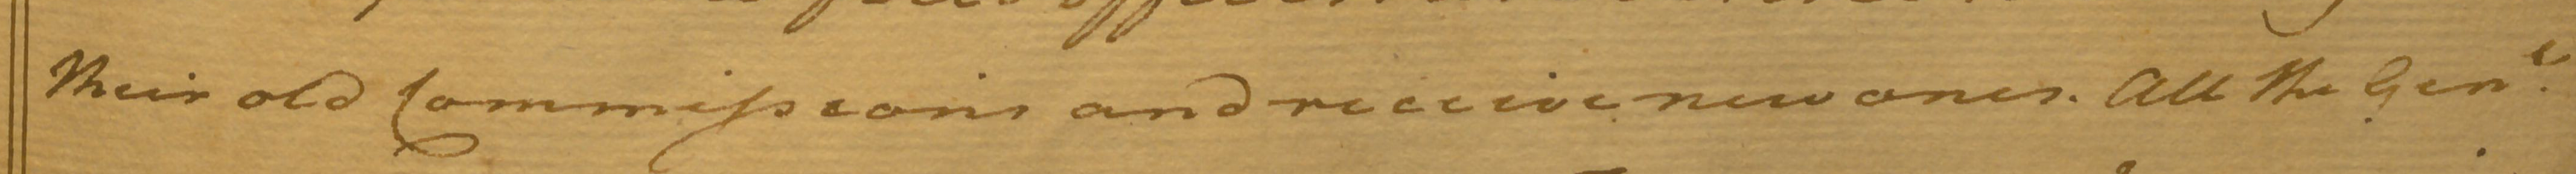their old Commissions and receive new ones. All the Gen^l.
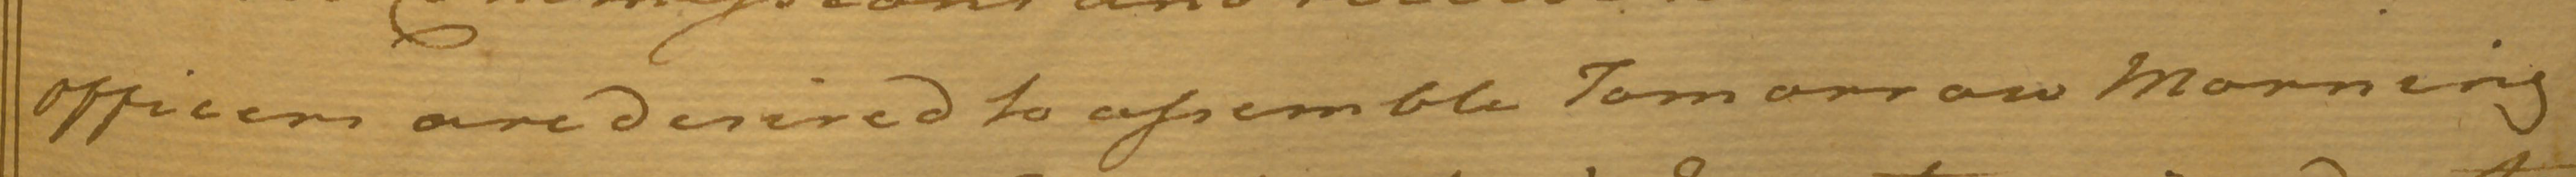officers are desired to assemble Tomorrow Morning
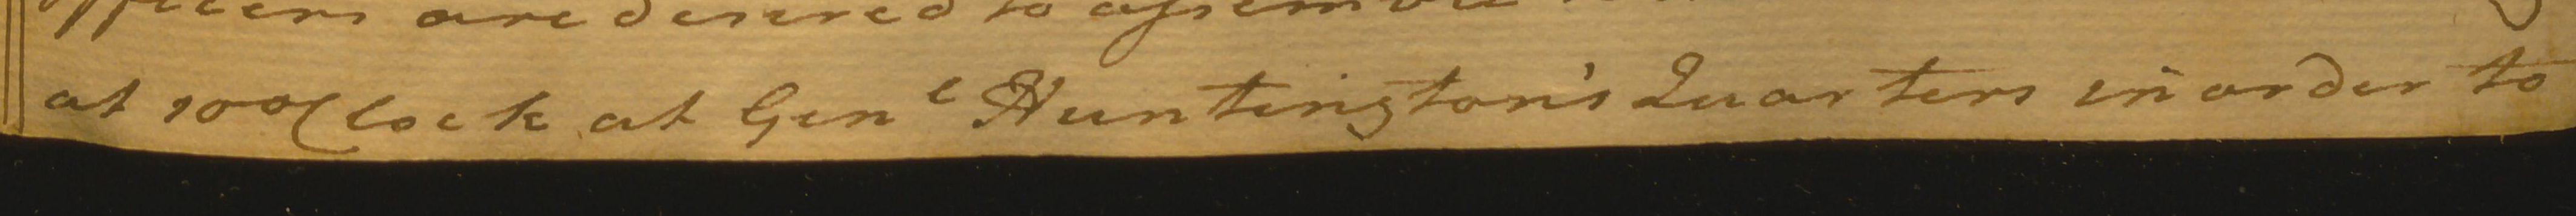at 10 ^oClock at Gen^l Huntington's Quarters in order to
